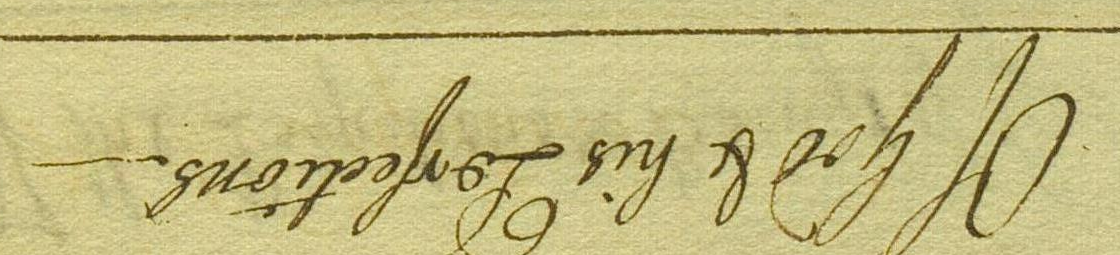Of God & his Perfections-
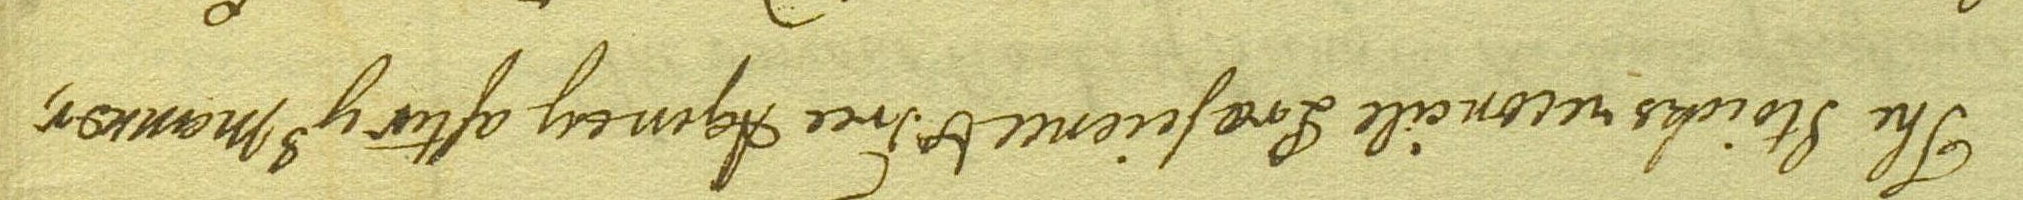The Stoicks reconcile Prescience & Free Agency after y^s Manner,
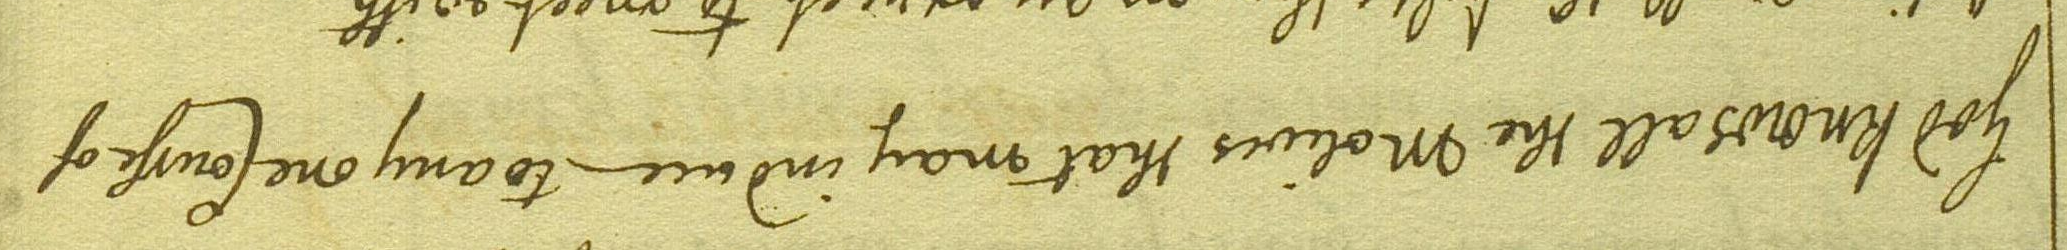God knows all the Motives that may induce to any one Course of
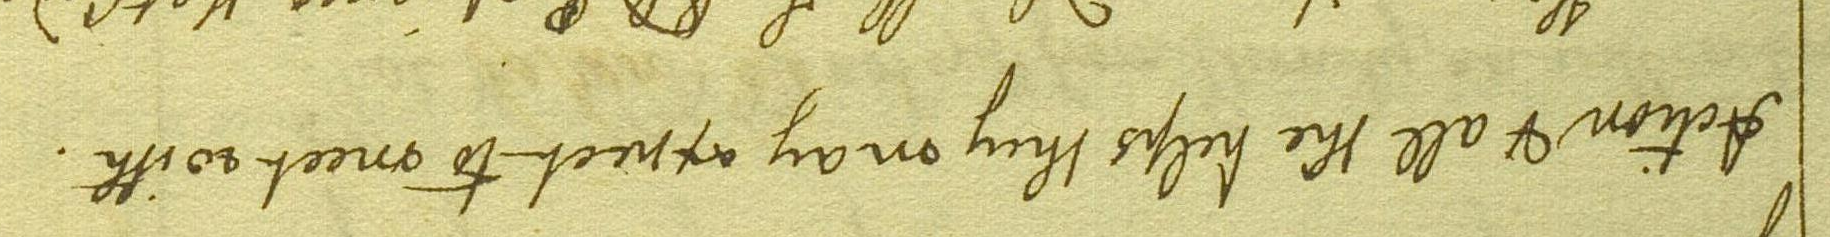Action & all the helps they may expect to meet with.
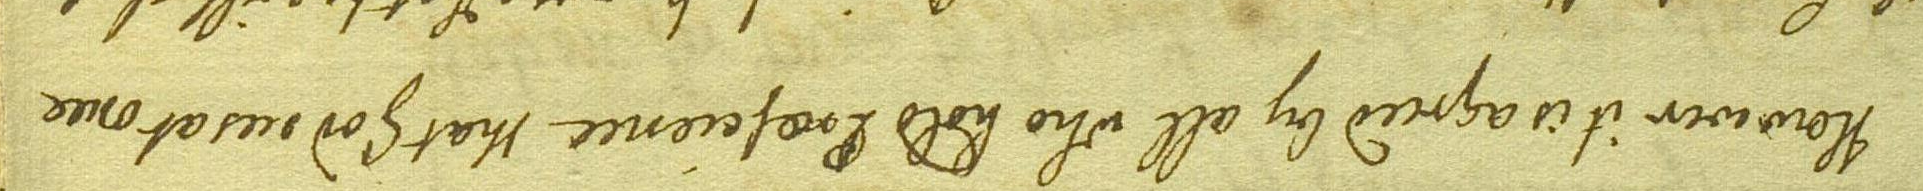However it is agreed by all who hold Prescience that God sees at once
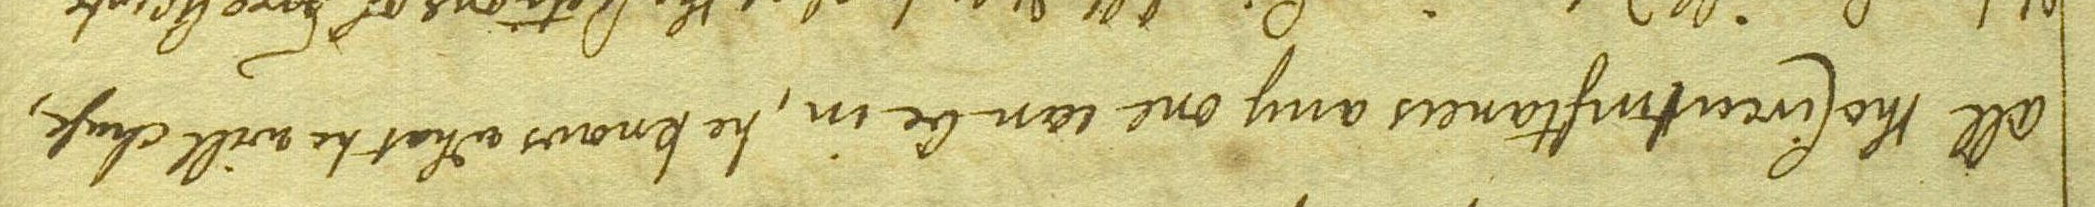all the Circumstances any one can be in, he knows what he will chuse,
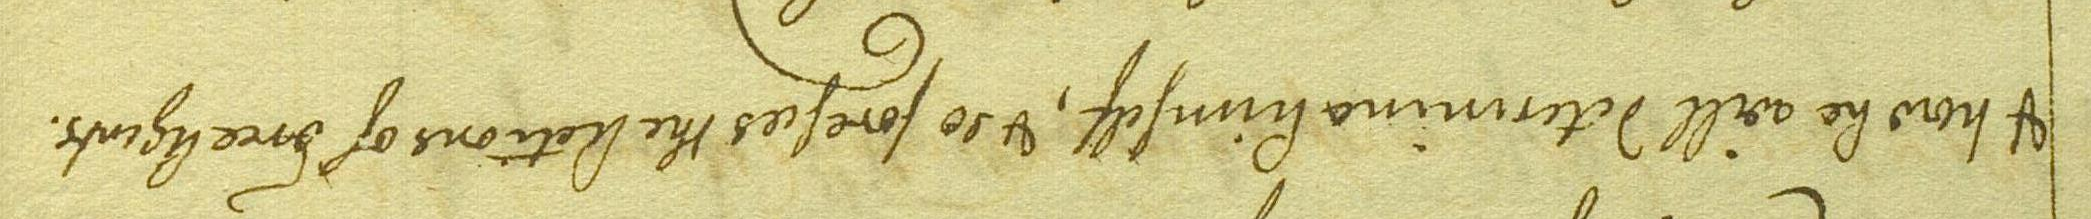& how he will determine himself, & so foresees the Actions of Free Agents.
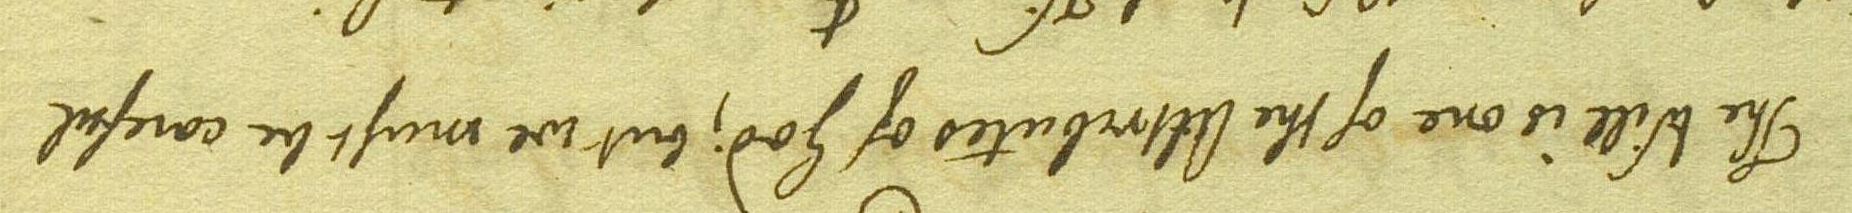The Will is one of the Attributes of God; but we must be careful
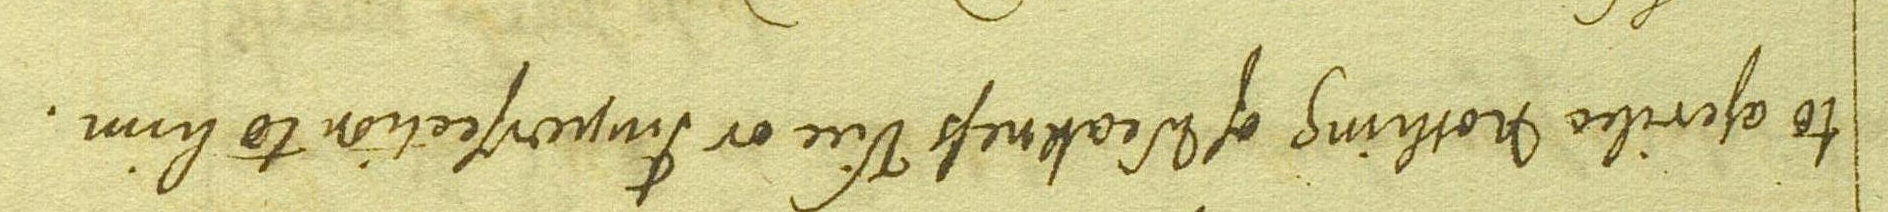to ascribe nothing of Weakness Vice or Imperfection to him.
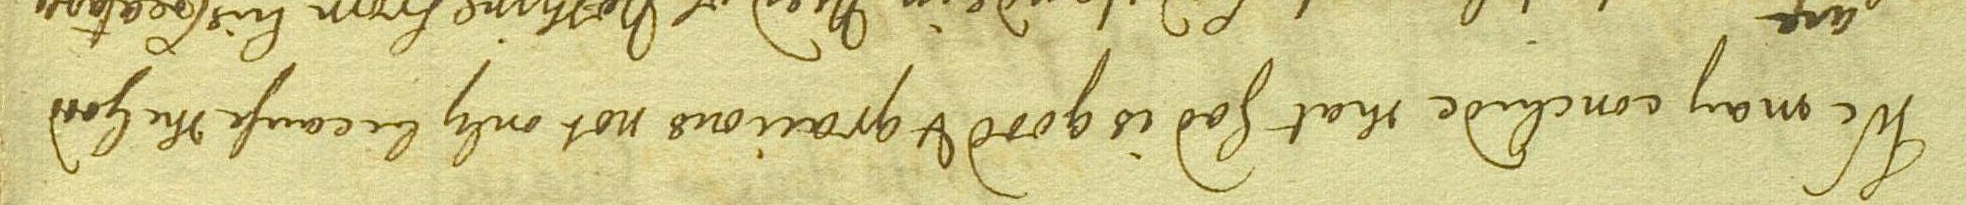We may conclude that God is good & gracious not only because the Good
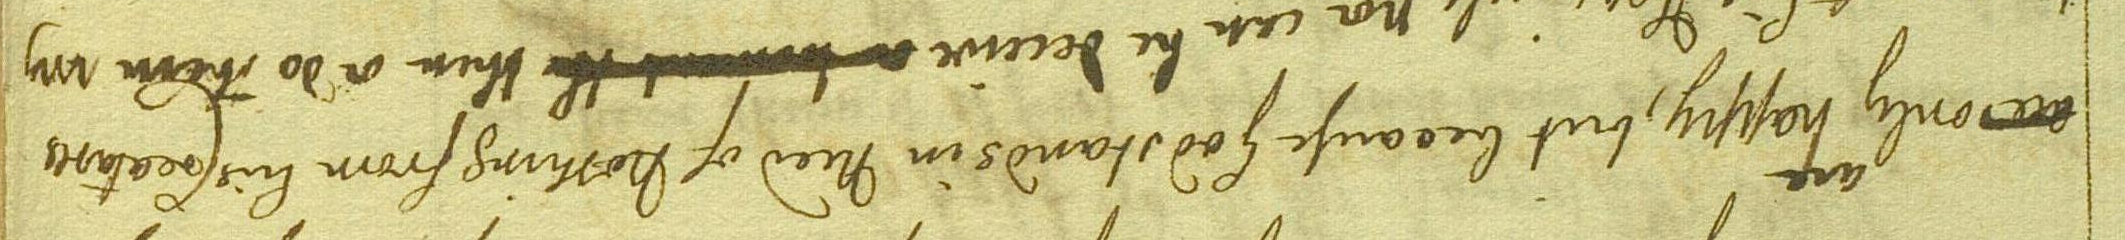[are] only ^are happy, but because God stands in Need of Nothing from his Creatures
